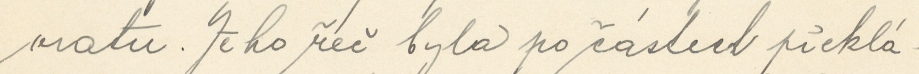vratu. Jeho řeč byla po částech překlá-
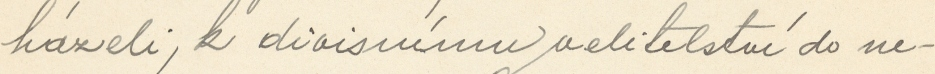házeli, k divisnímu velitelství do ne-
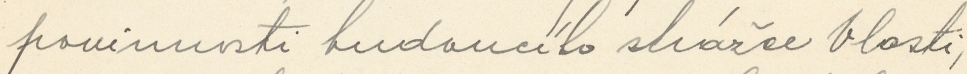povinnosti budoucího strážce vlasti,
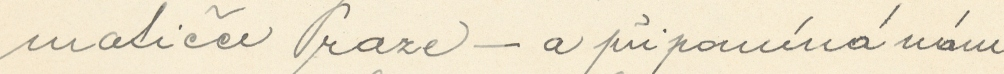matičce Praze - a připomíná nám
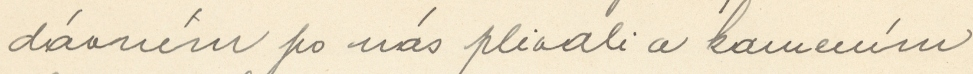dávnem po nás plivali a kamením
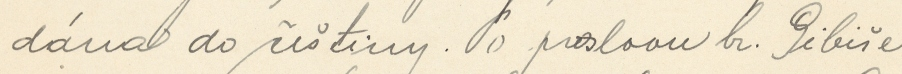dána do češtiny. Po proslovu br. Pibiše
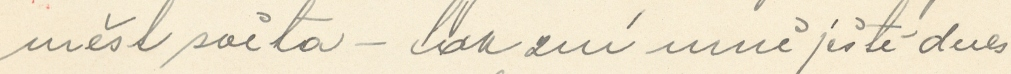měst světa - tak zní mně ještě dnes
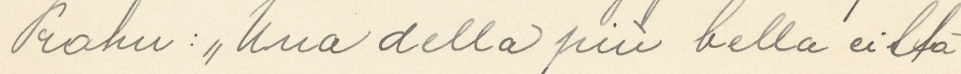Prahu: „Una della pin bella citta-
